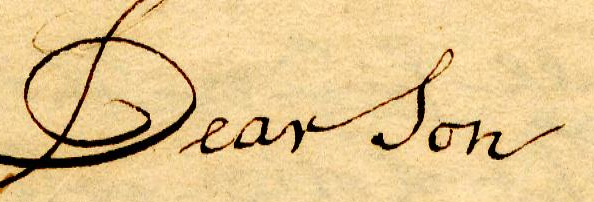Dear Son
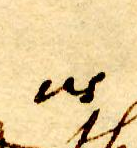us
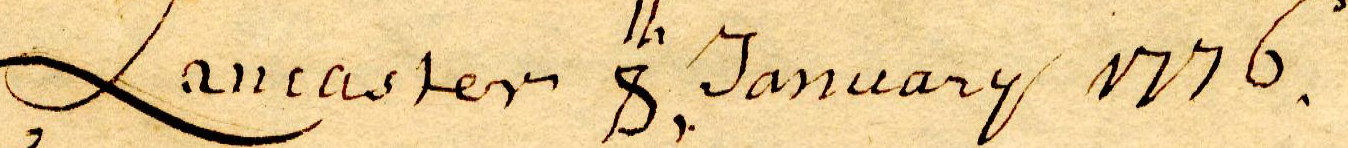Lancaster 8^th, January 1776.
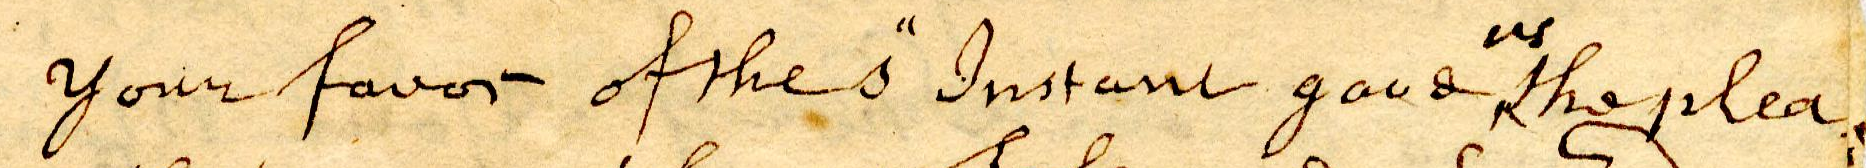Your favor of the 1^st Instant gave ^ the plea
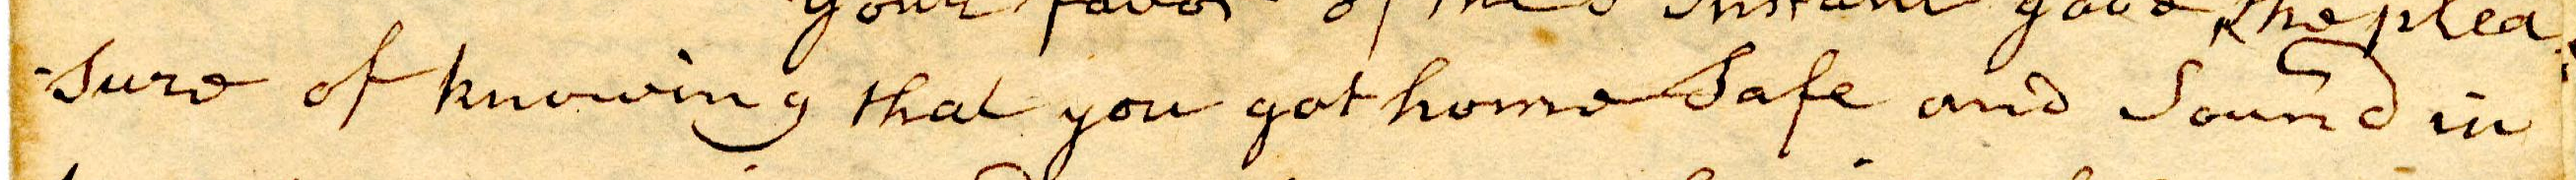-sure of knowing that you got home safe and Sound in
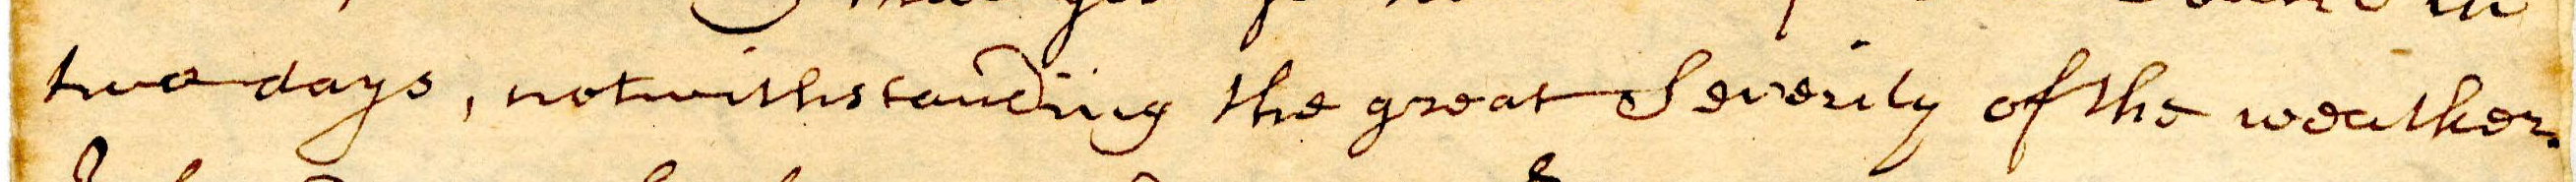two days, notwithstanding the great severity of the weather.
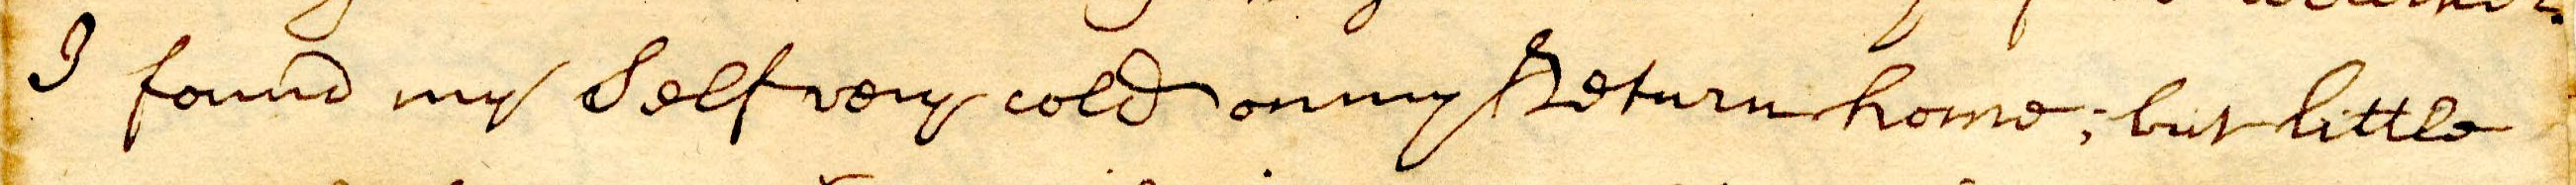I found my self very cold on my return home; but little
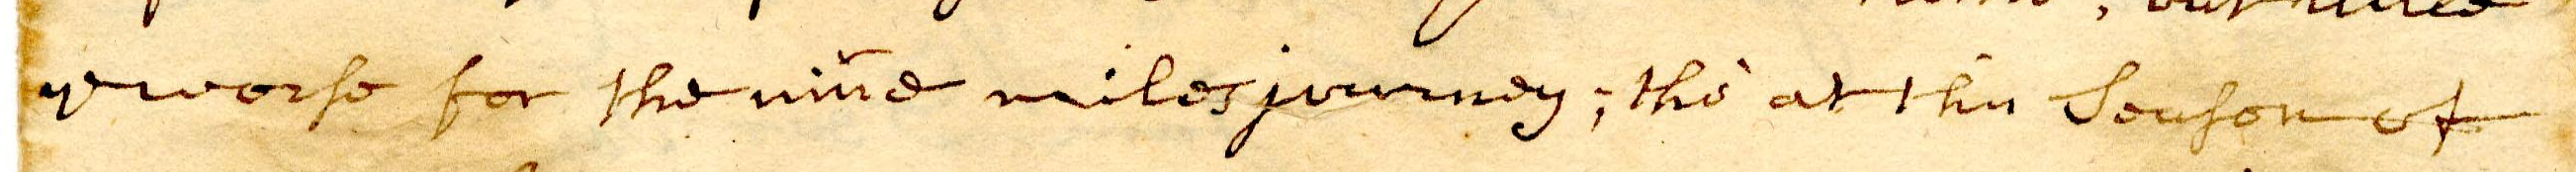worse for the nine miles journey; this at this season of
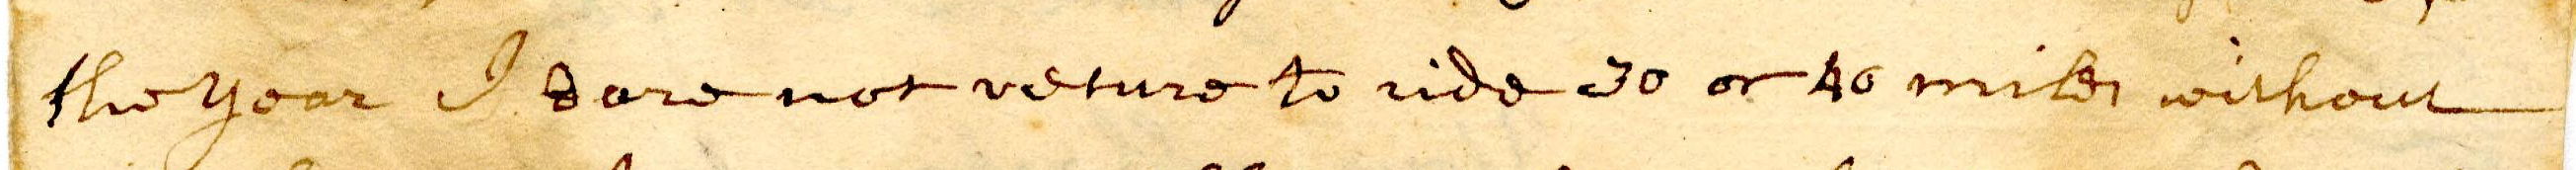the year I dare not venture to ride 30 or 40 miles without
